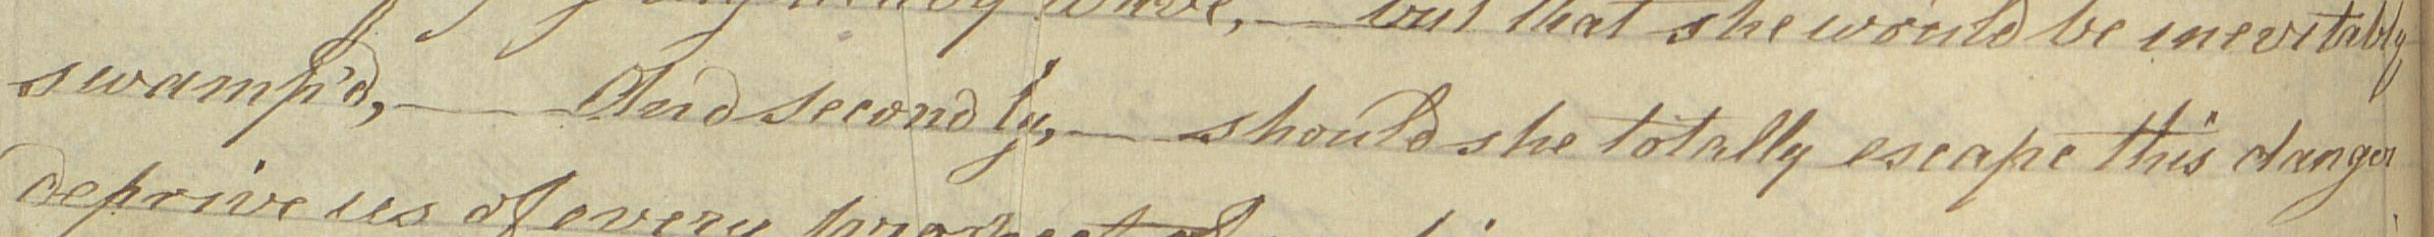swamp'd, And secondly, should she totally escape this danger
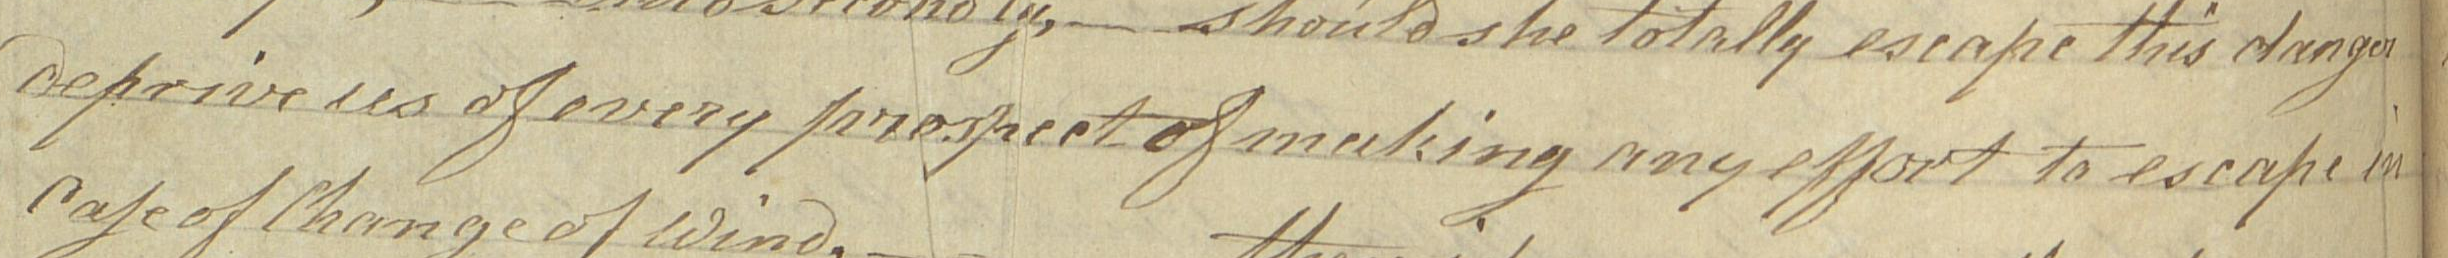deprive us of every prospect of making my effort to escape in
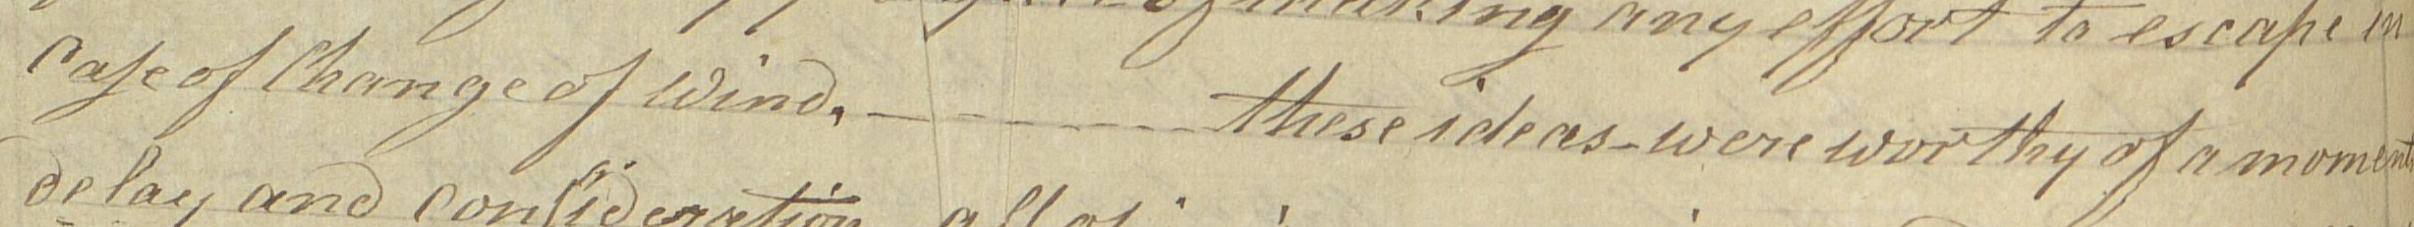Case of Change of Wind, These ideas were worthy of a moment
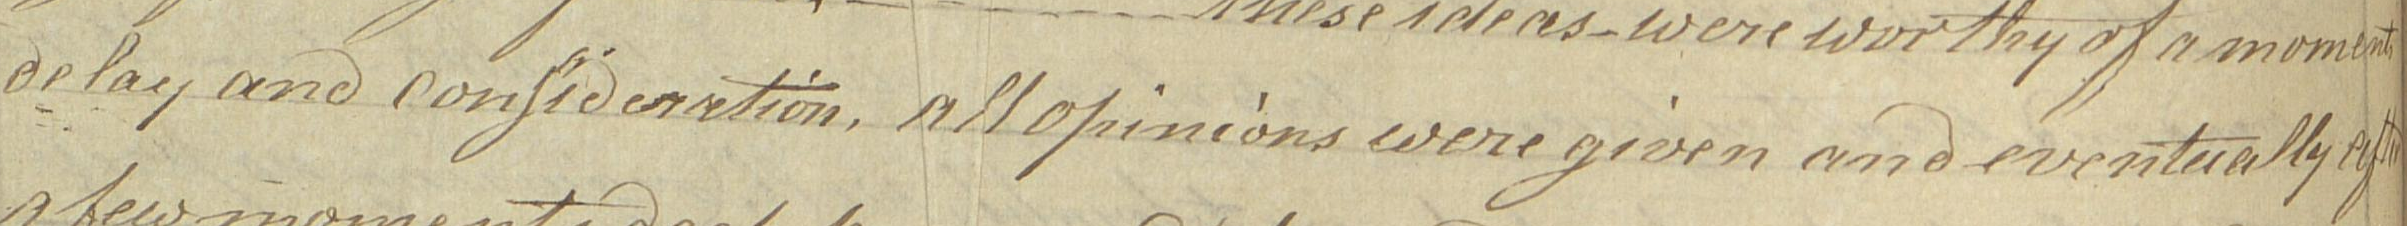delay and consideration, All opinions were given and eventually Aft-
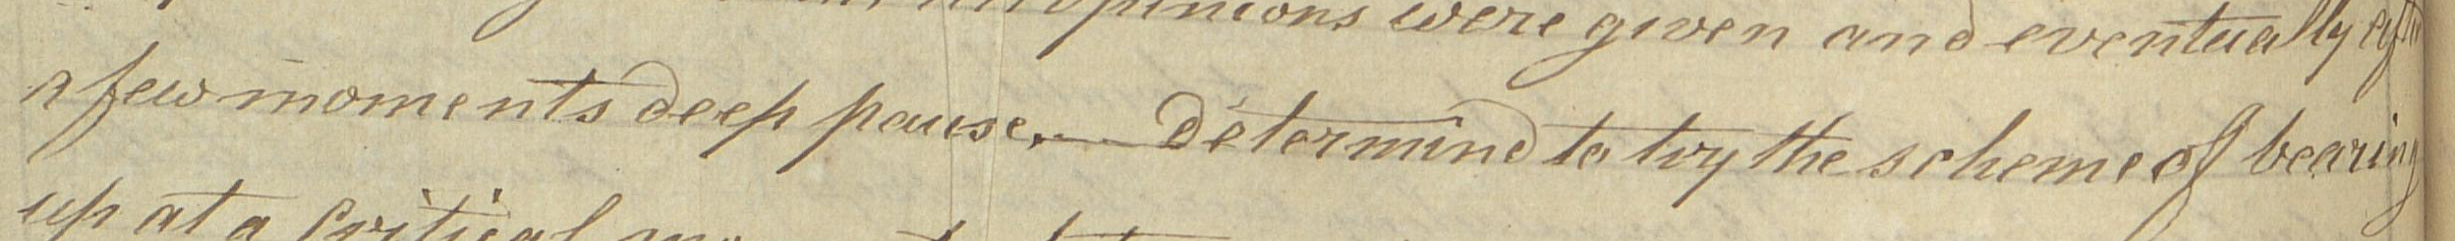a few moments deep pause, determind to try the scheme of bearing
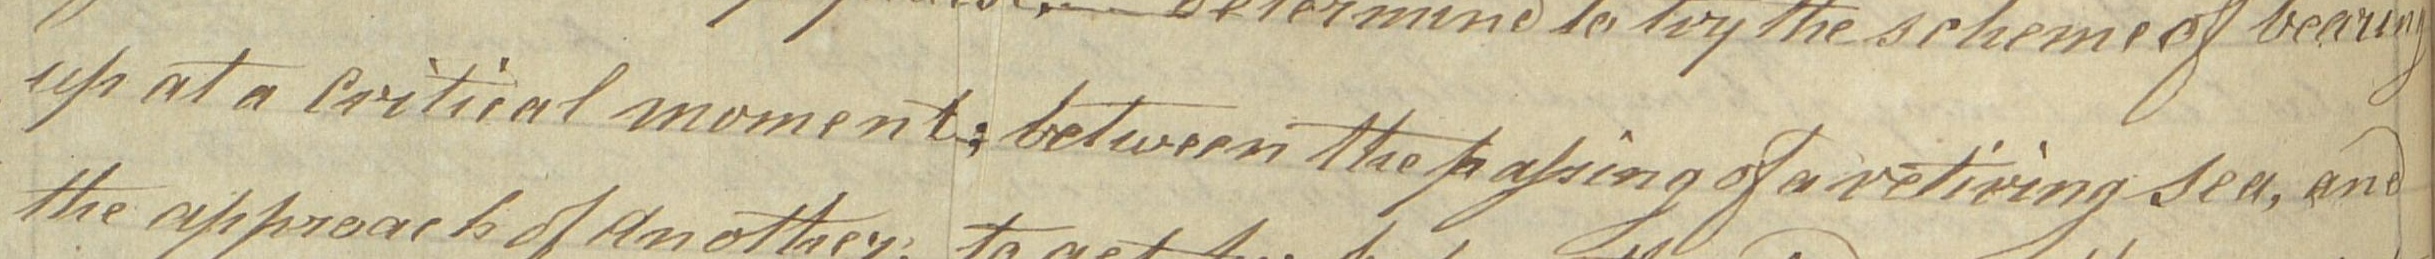up at a Critical moment; between the passing of a retiring sea, and
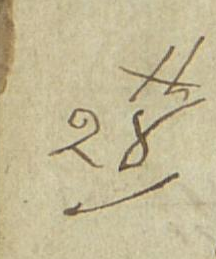28^th
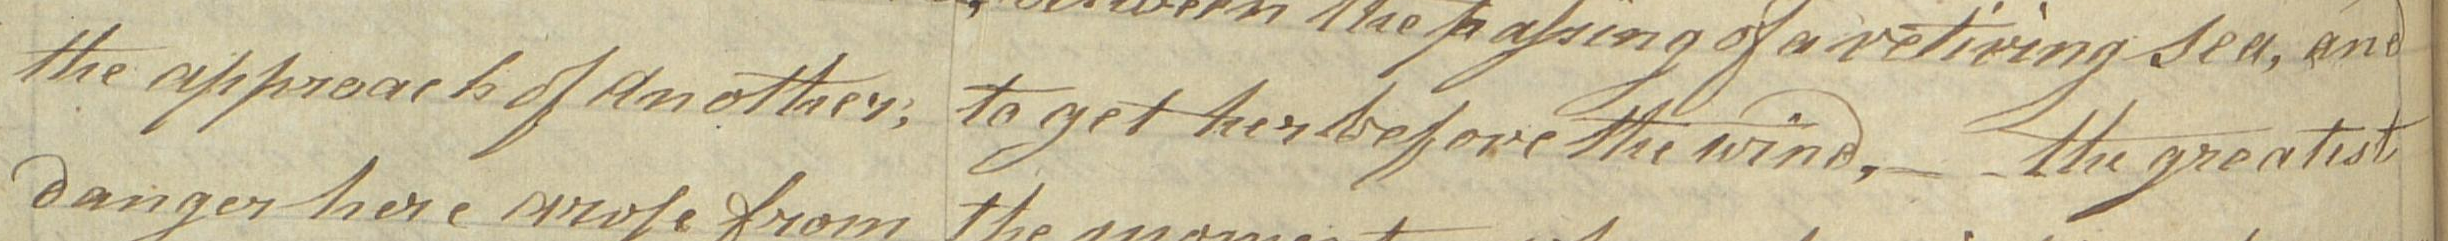the approach of another; to get her before the wind, the greatest
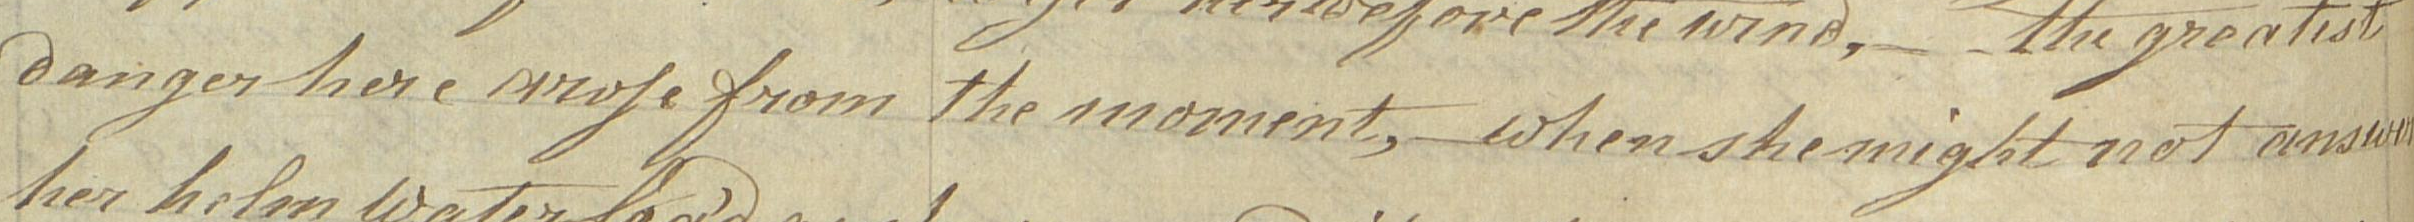danger here arose from the moment, when she might not answer
